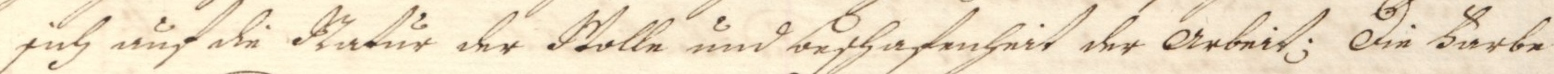sich auf die Natur der Wolle und Beschafenheit der Arbeit. Die Farbe
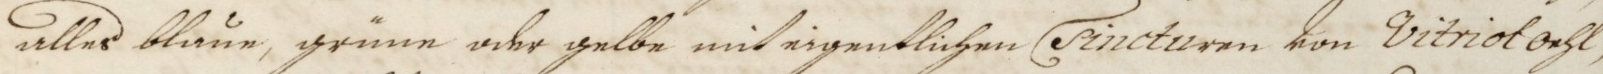alles blaue, grüne oder gelbe mit eigentlichen Tincturen von Vitriol Oehl,
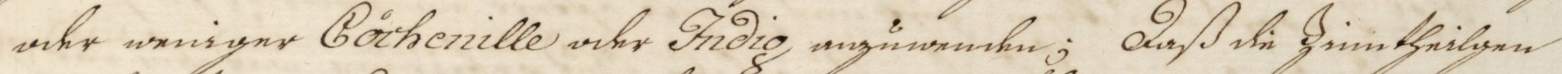oder weniger Cochenille oder Indig anzuwenden. Daß die Zinntheilgen
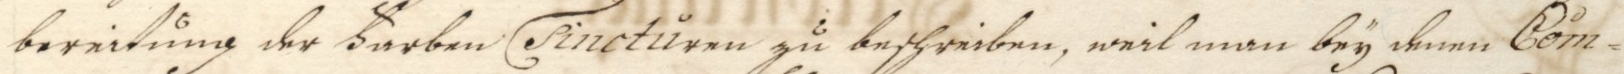bereitung der Farben Tincturen zu beschreiben, weil man bey denen Com-
